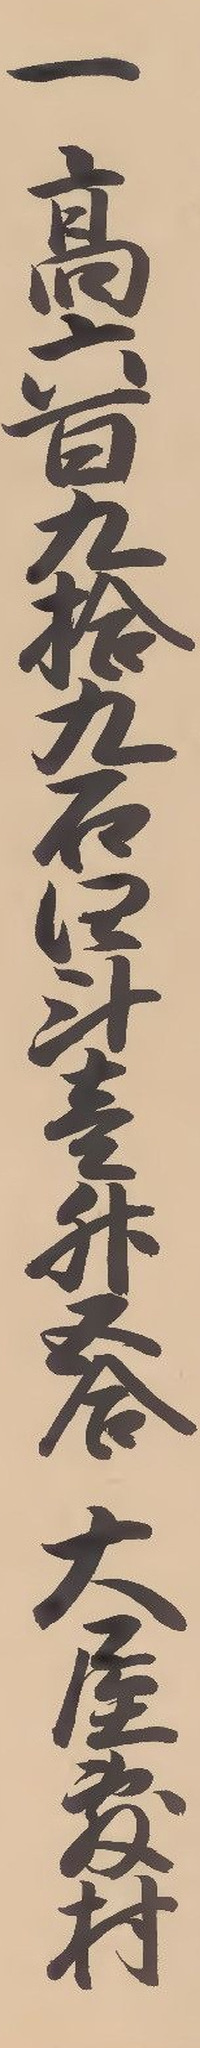一高六百九拾九石四斗壱升五合大屋敷村
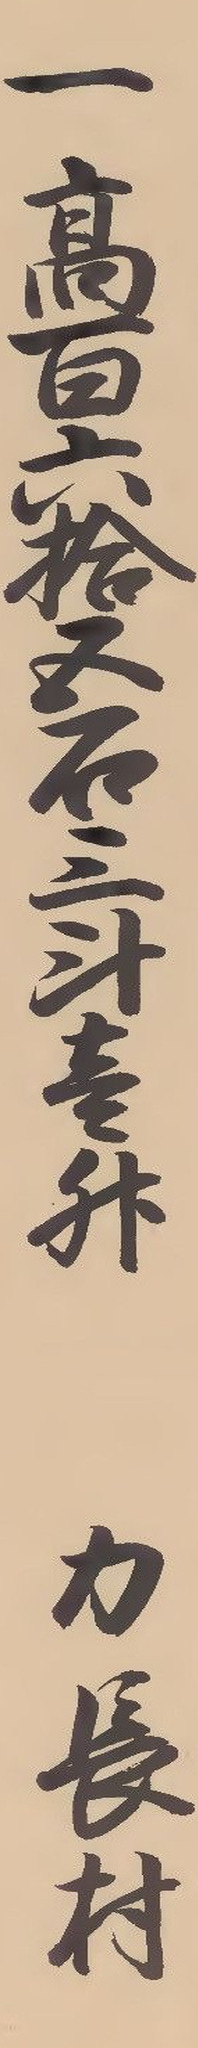一高百六拾五石三斗壱升力長村
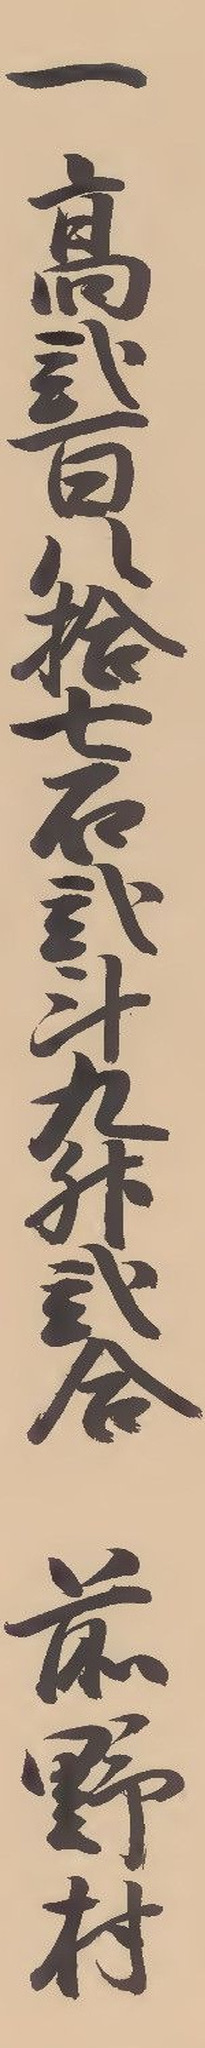一高弐百八拾七石弐斗九升弐合前野村
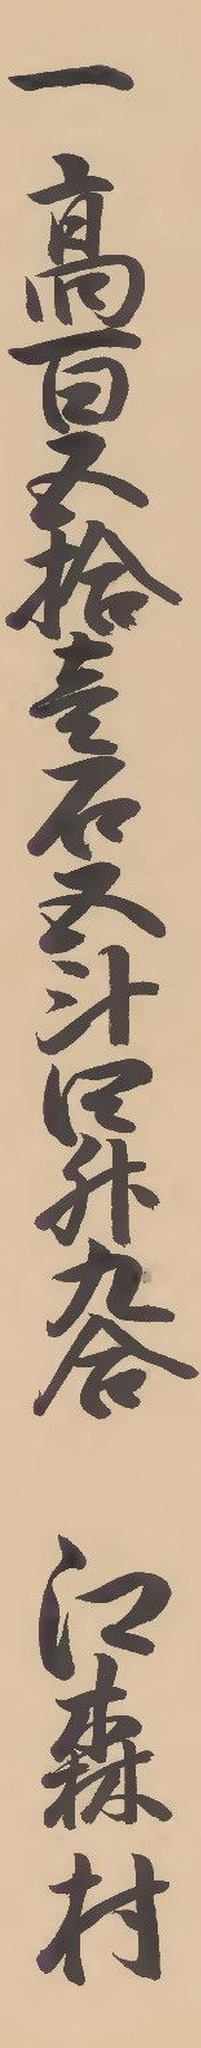一高百五拾壱石五斗四升九合江森村

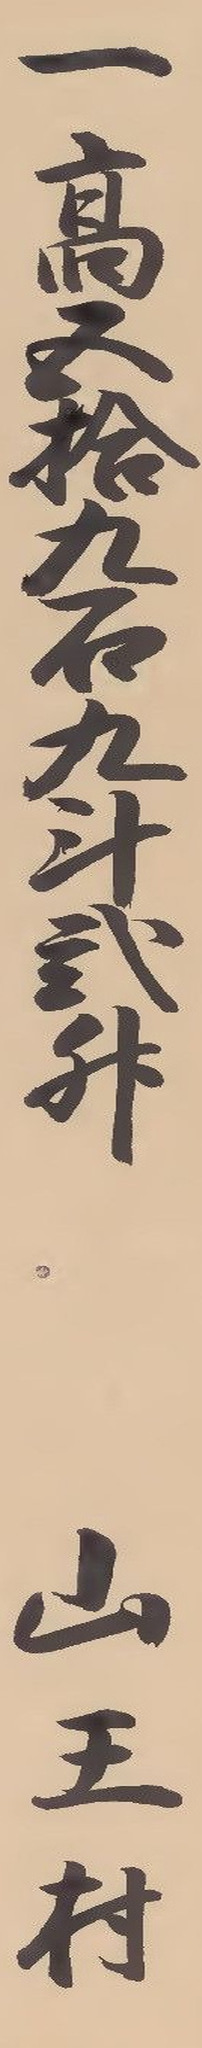一高五拾九石九斗弐升山王村
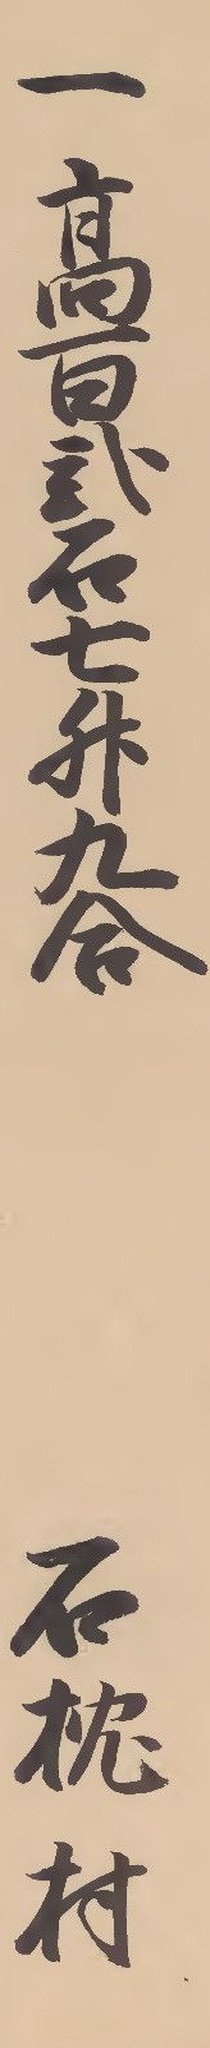一高百弐石七升九合石枕村
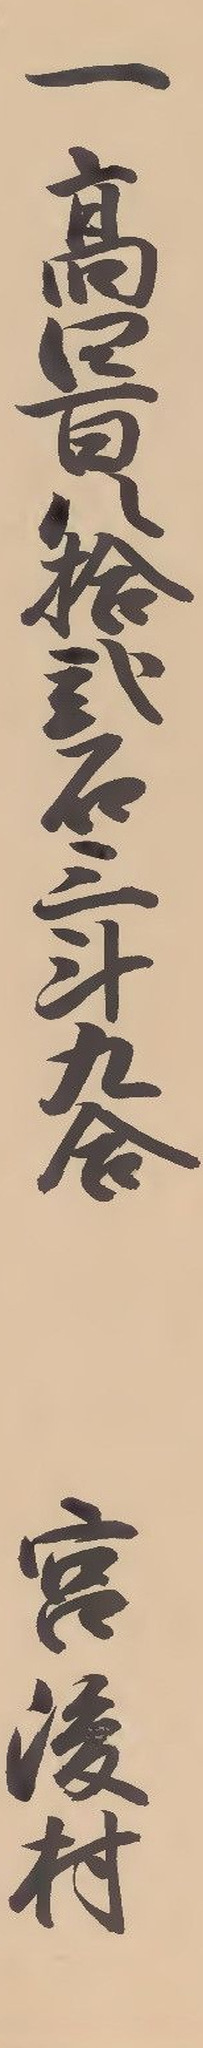一高四百八拾弐石三斗九合宮後村
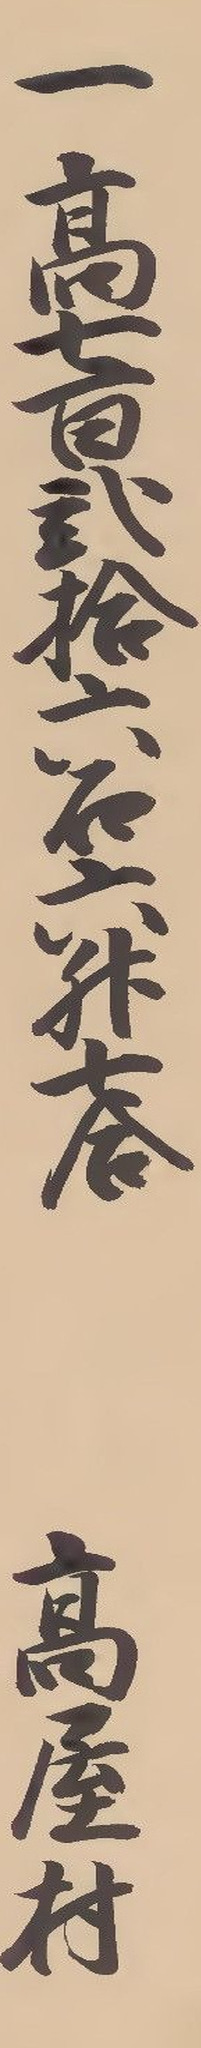一高七百弐拾六石六升七合高屋村
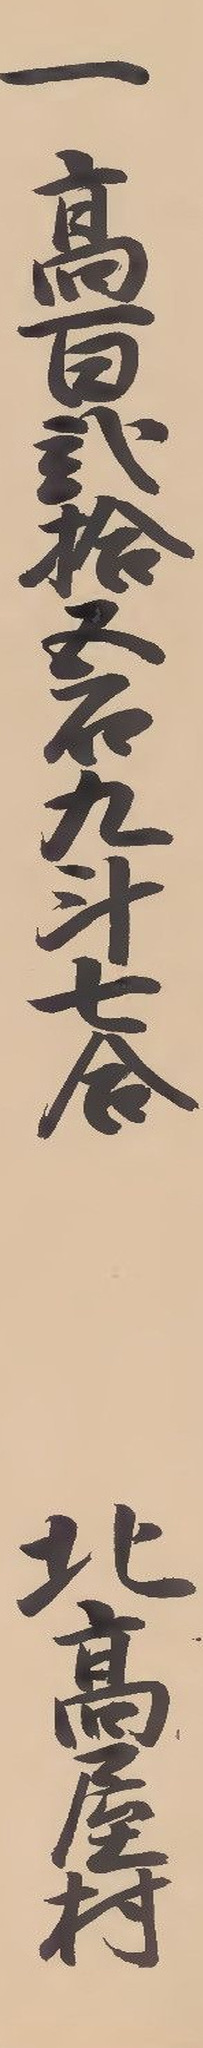一高百弐拾五石九斗七合北高屋村
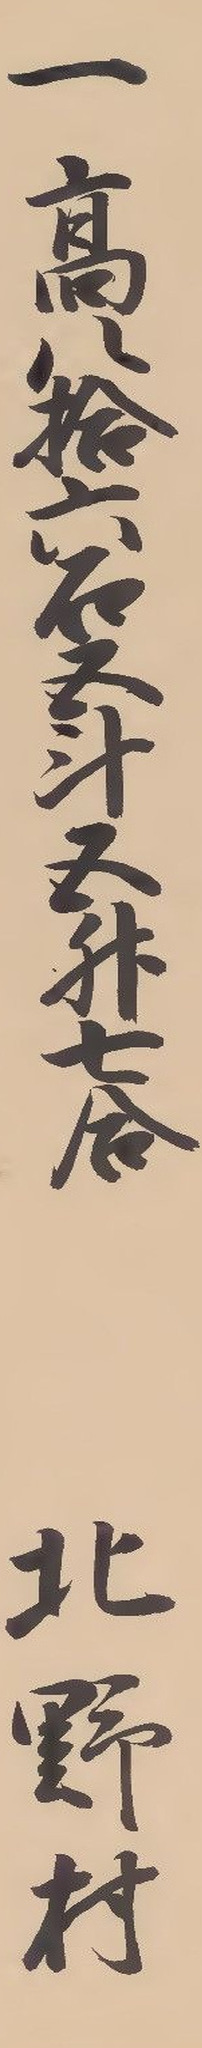一高八拾六石五斗五升七合北野村
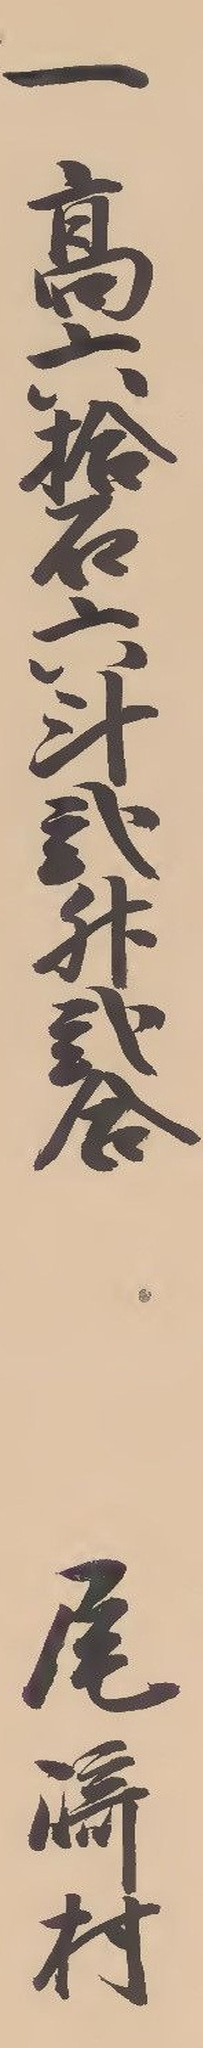一高六拾石六斗弐升弐合尾崎村

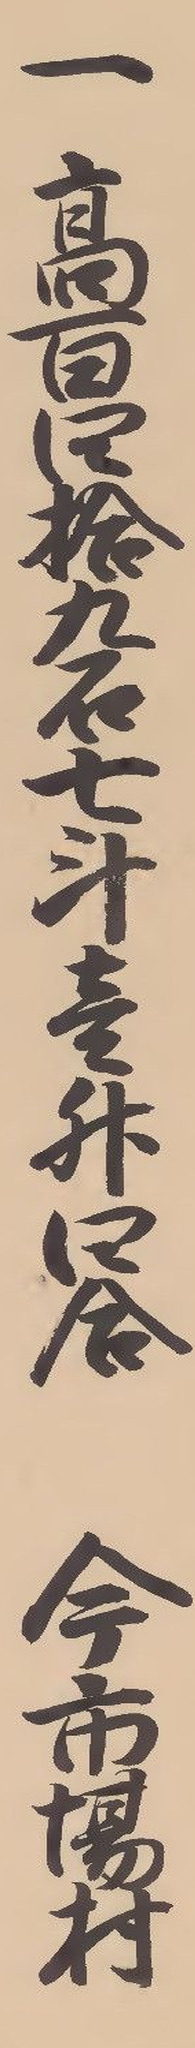一高百四拾九石七斗壱升四合今市場村
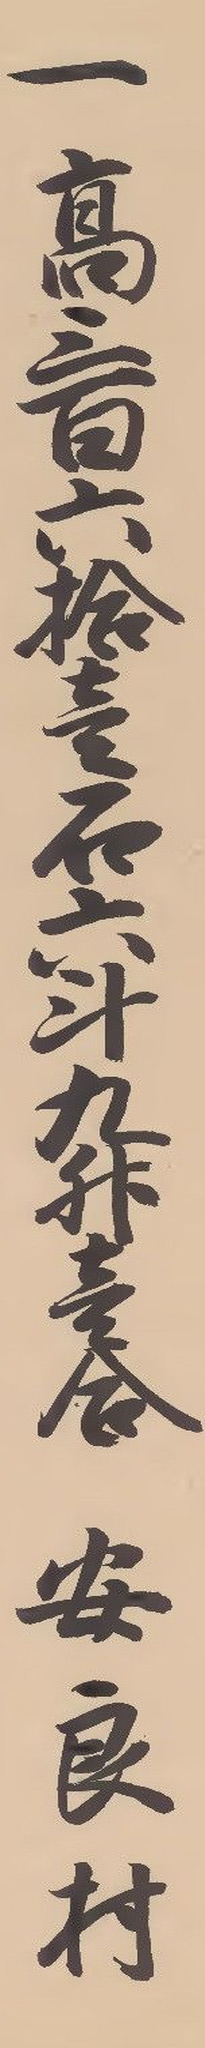一高三百六拾壱石六斗九升壱合安良村
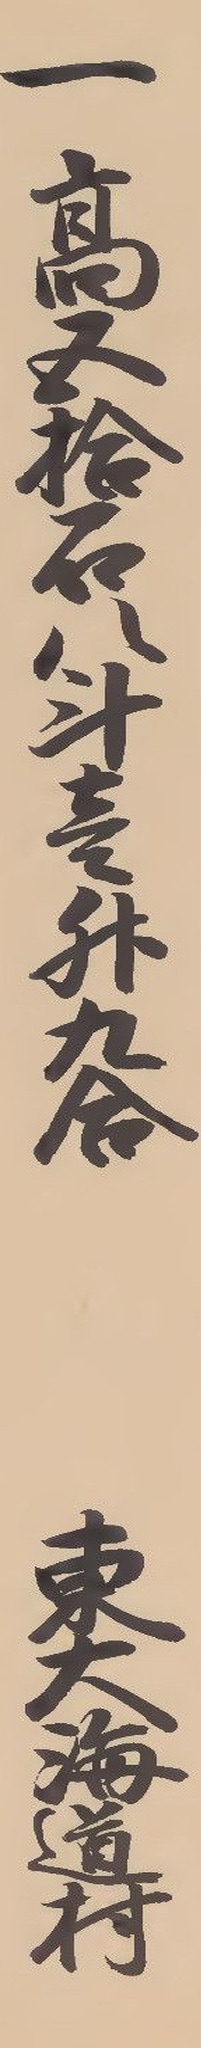一高五拾石八斗壱升九合東大海道村
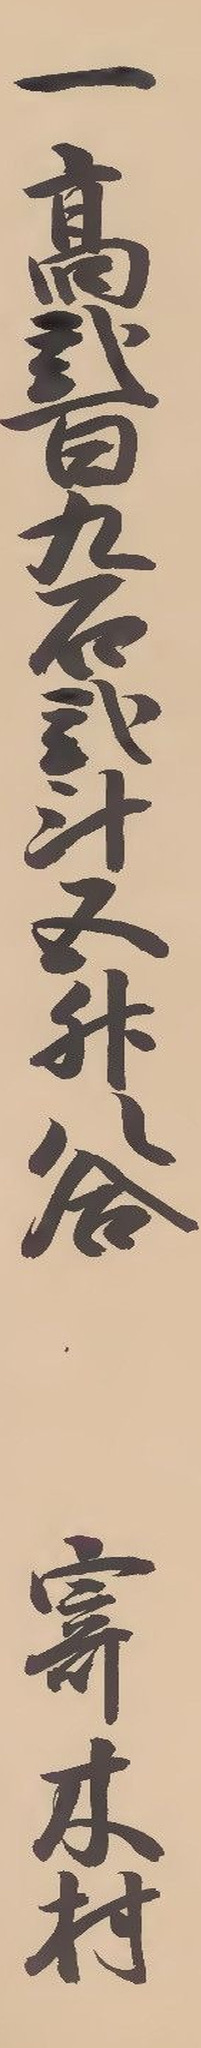一高弐百九石弐斗五升八合寄木村
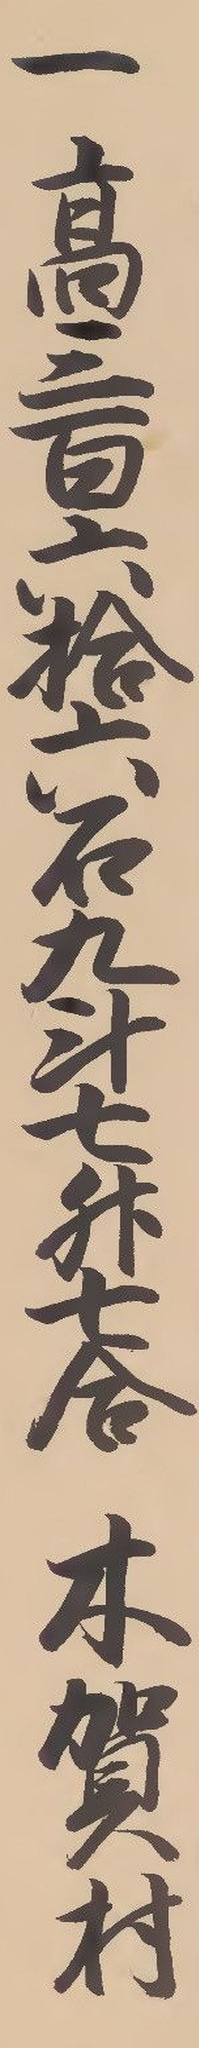一高三百六拾六石九斗七升七合木賀村
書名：尾張国郷帳
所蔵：国立公文書館 National Archives of Japan
